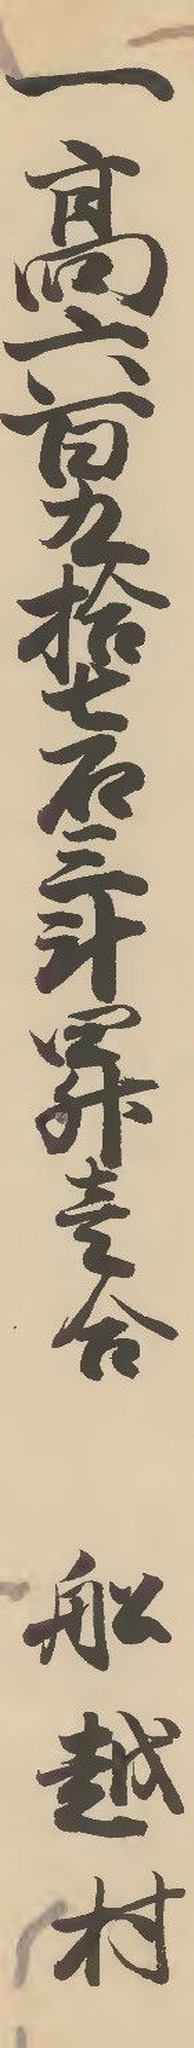一髙六百九拾七石三斗四升壱合舩越村

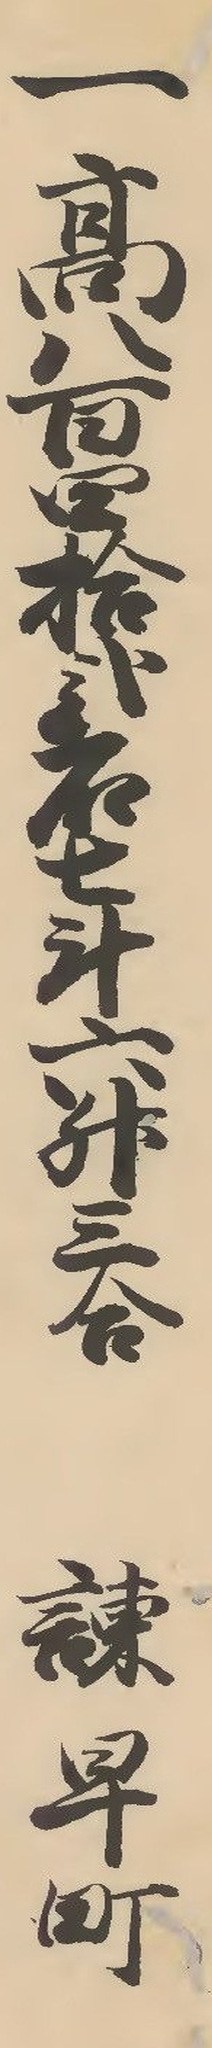一髙八百四拾弐石七斗六升三合諫早町
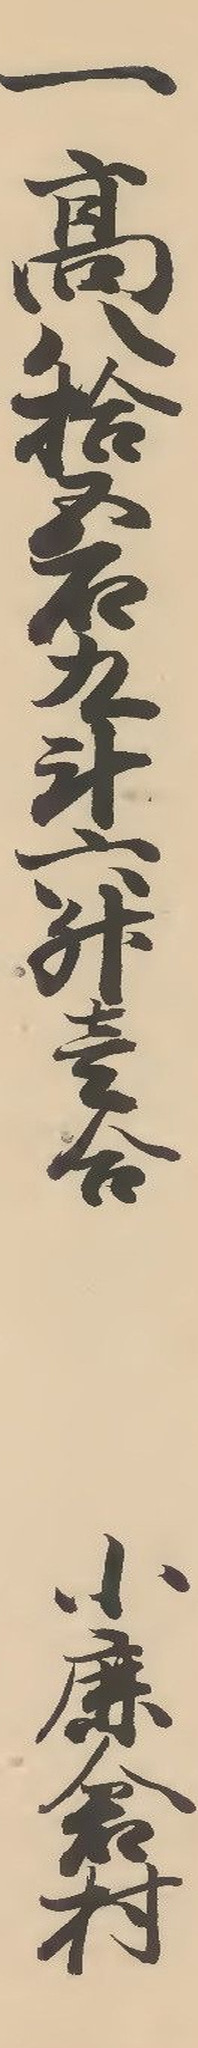一髙八拾五石九斗六升壱合小鹿倉村
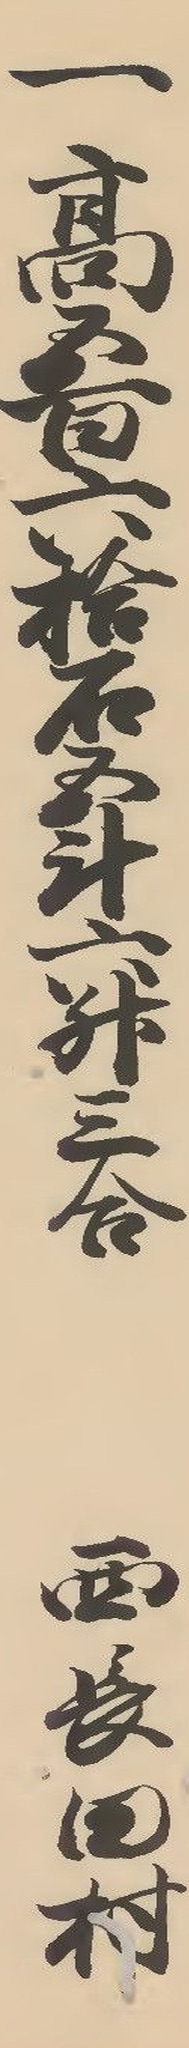一髙五百六拾石五斗六升三合西長田村
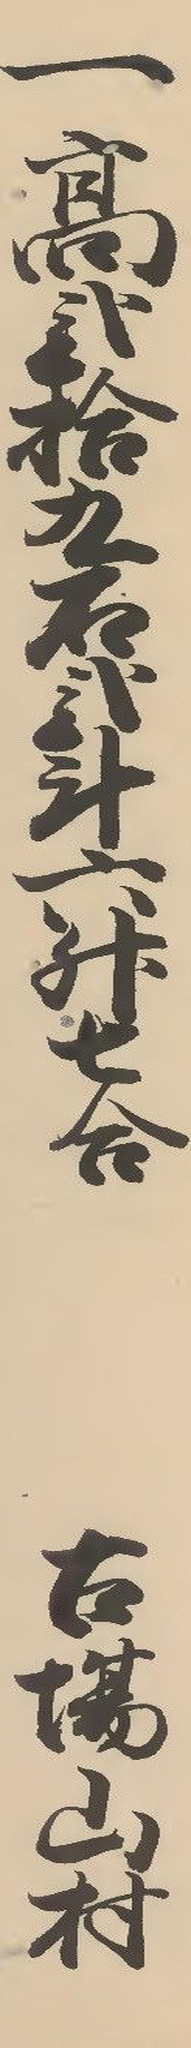一髙弐拾九石弐斗六升七合古場山村
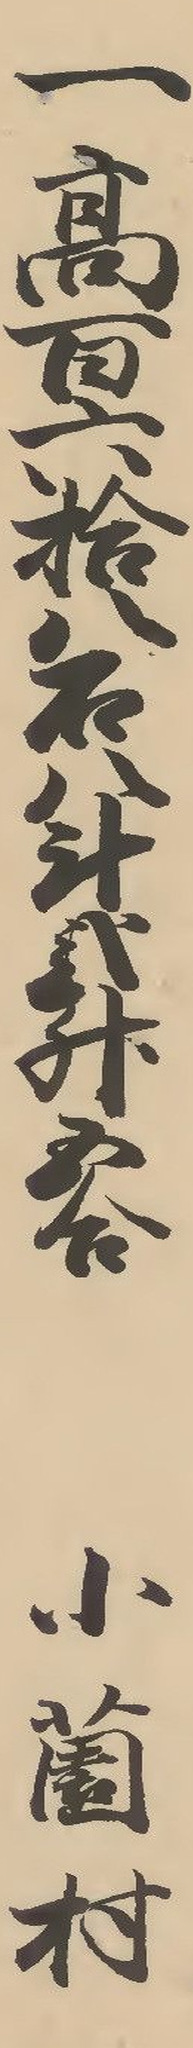一髙百六拾八石八斗弐升五合小薗村
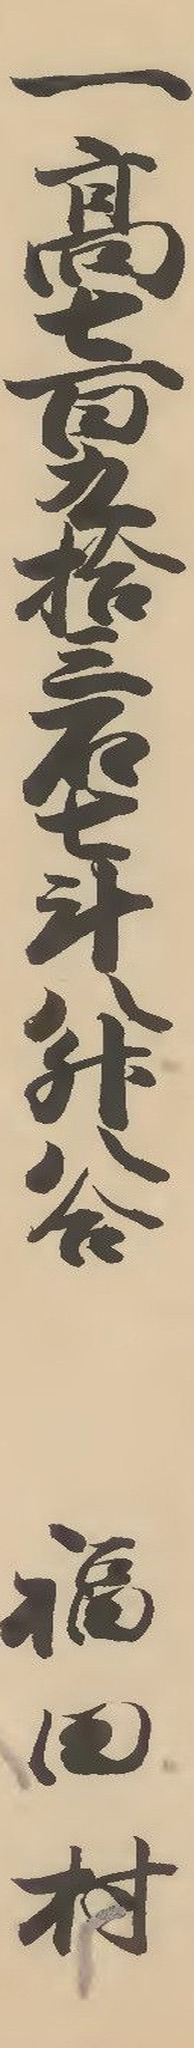一髙七百九拾三石七斗八升八合福田村
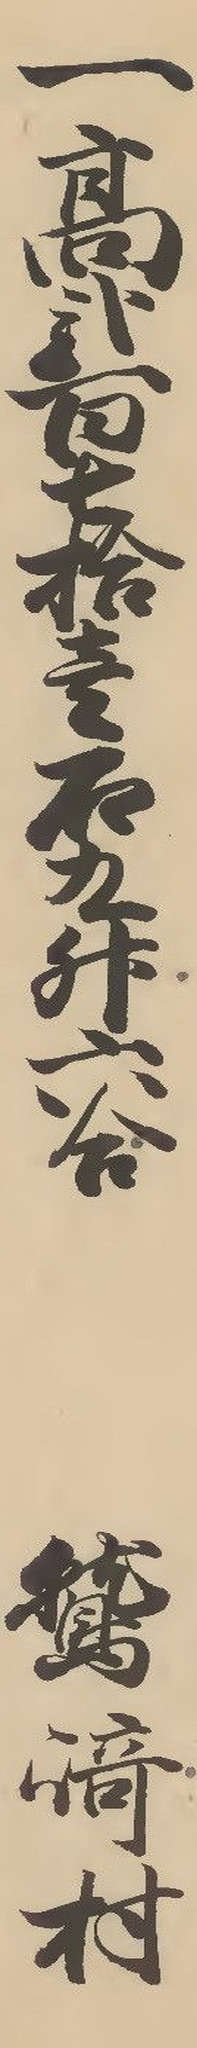一髙弐百七拾壱石九升六合鷲崎村
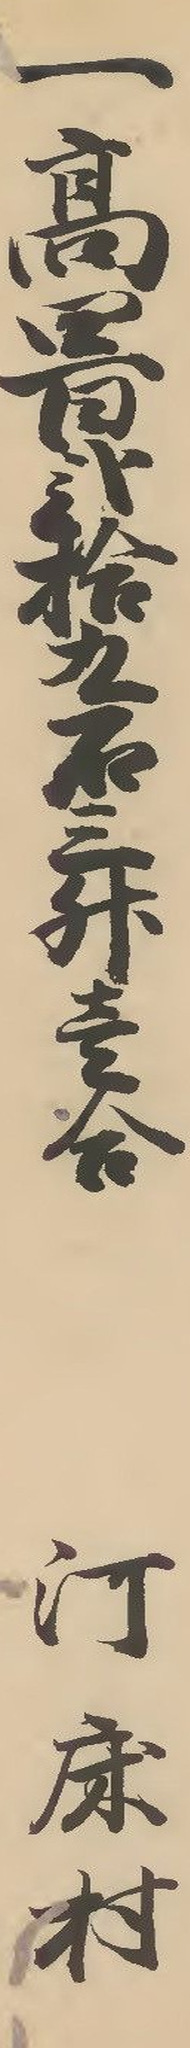一髙四百弐拾九石三升壱合河床村

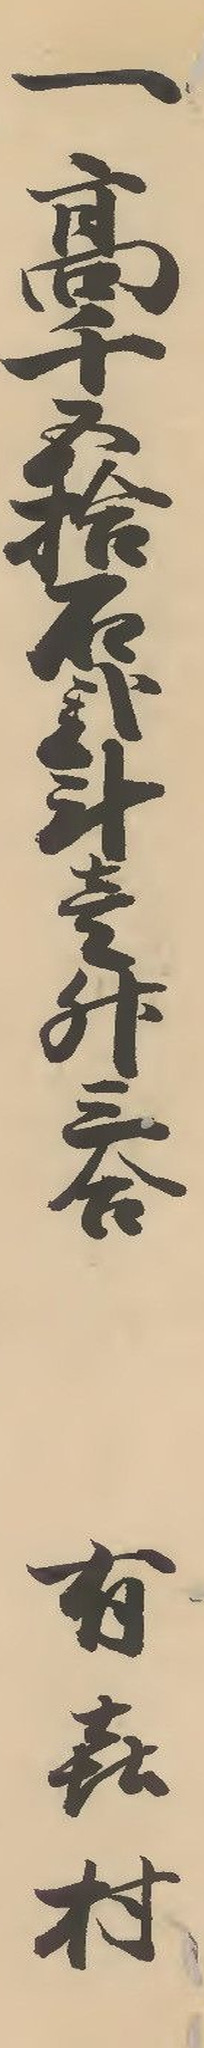一髙千五拾石弐斗壱升三合有喜村
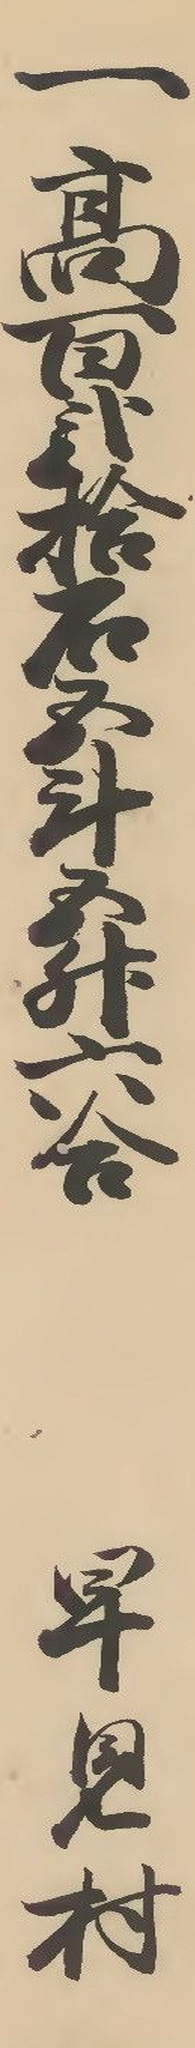一髙百弐拾石五斗五升六合早見村
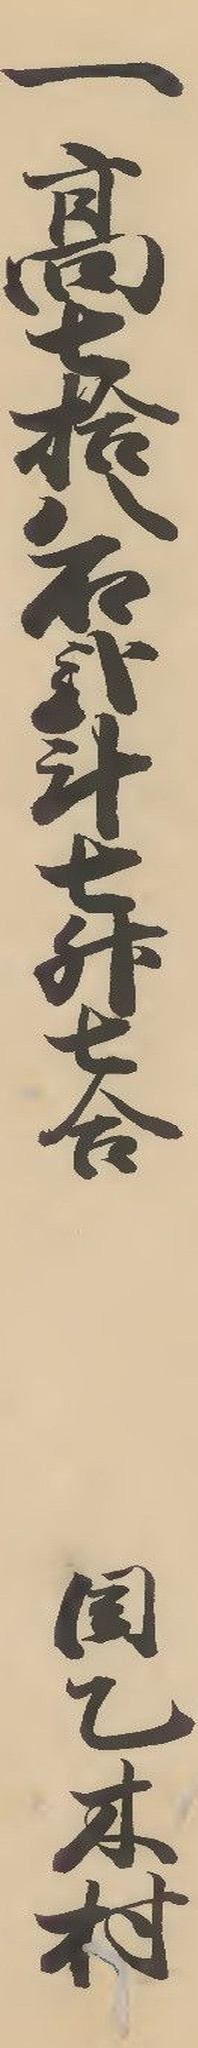一髙七拾八石弐斗七升七合目乙木村
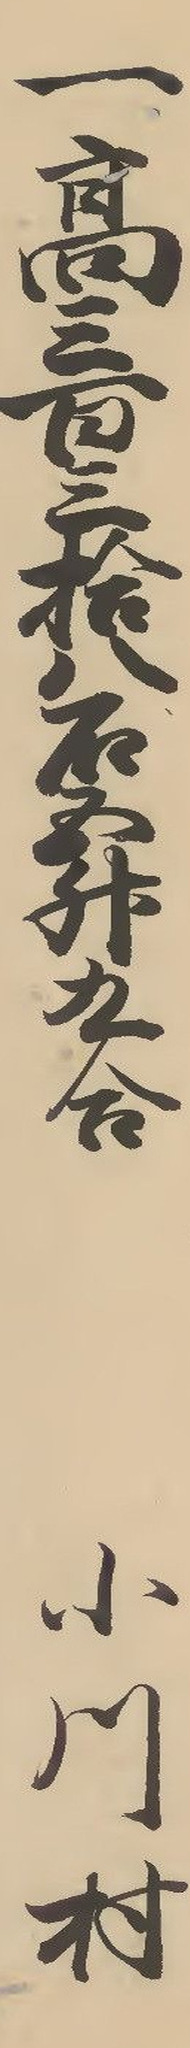一髙三百三拾八石五升九合小川村
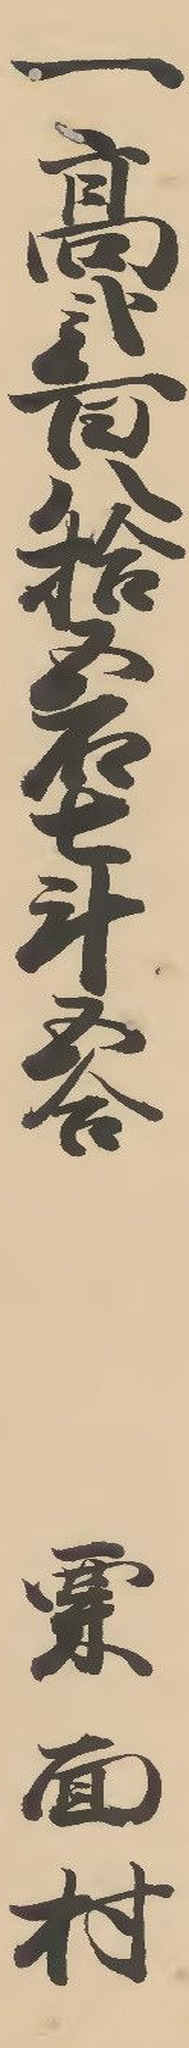一髙弐百八拾五石七斗五合栗面村
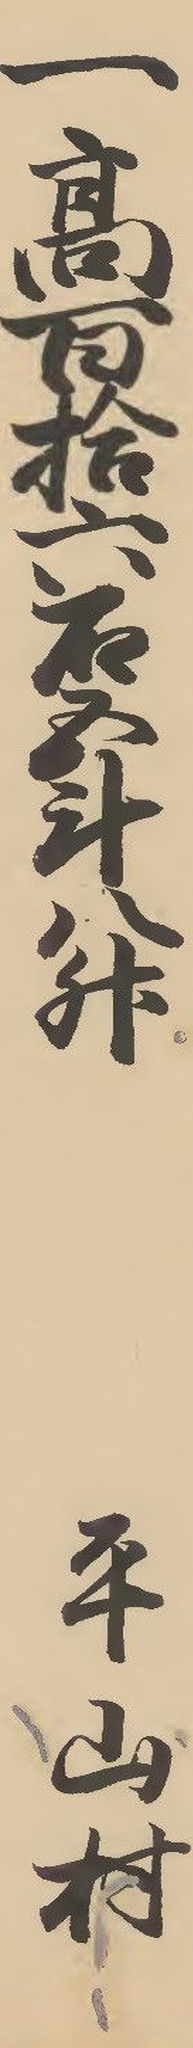一髙百拾六石五斗八升平山村
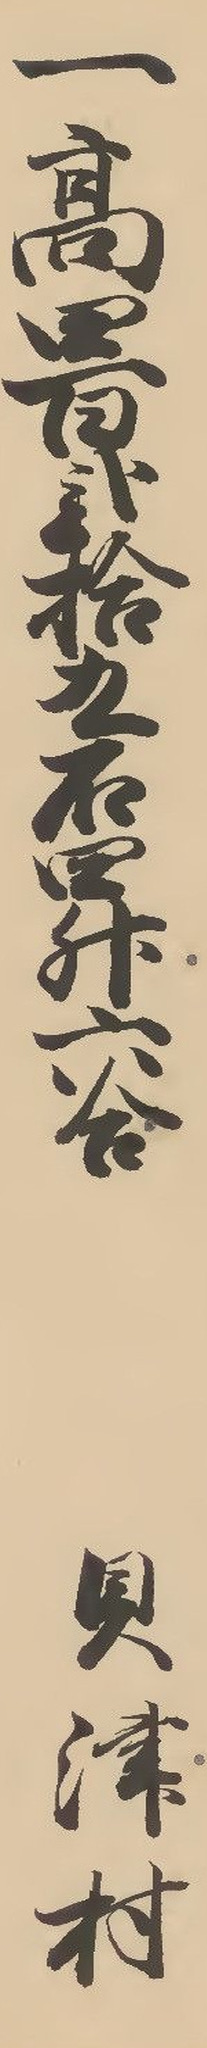一髙四百弐拾九石四升六合貝津村
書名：肥前国郷帳
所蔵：国立公文書館 National Archives of Japan
